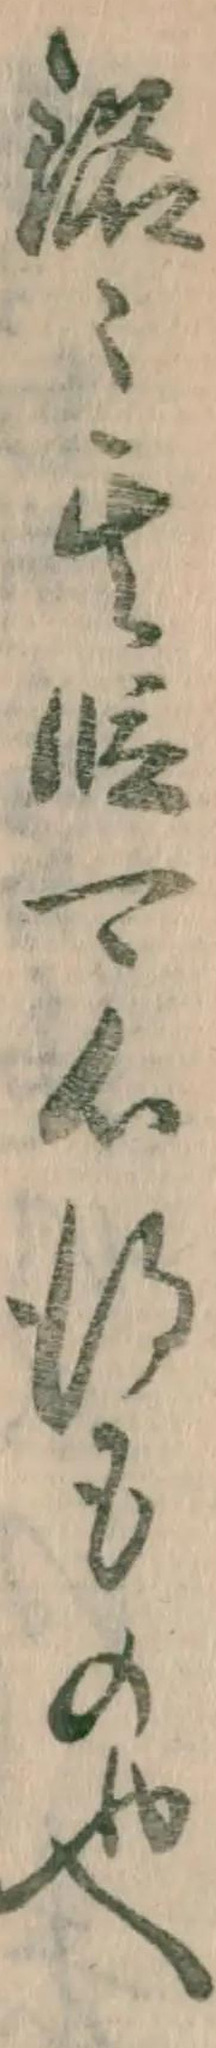銘々其段可心得もの也
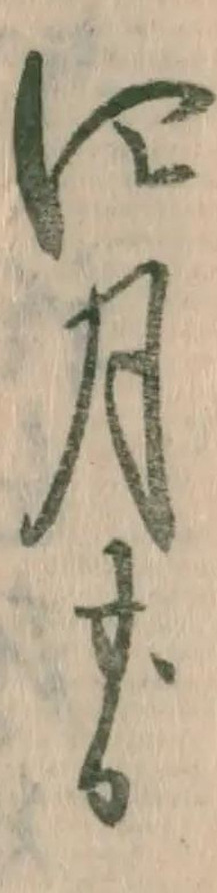四月廿日
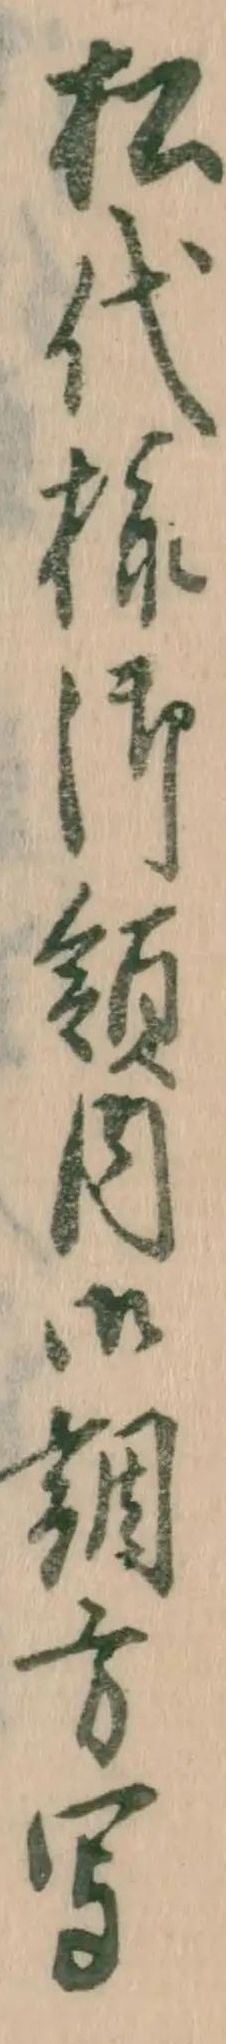松代様御領内御調方写
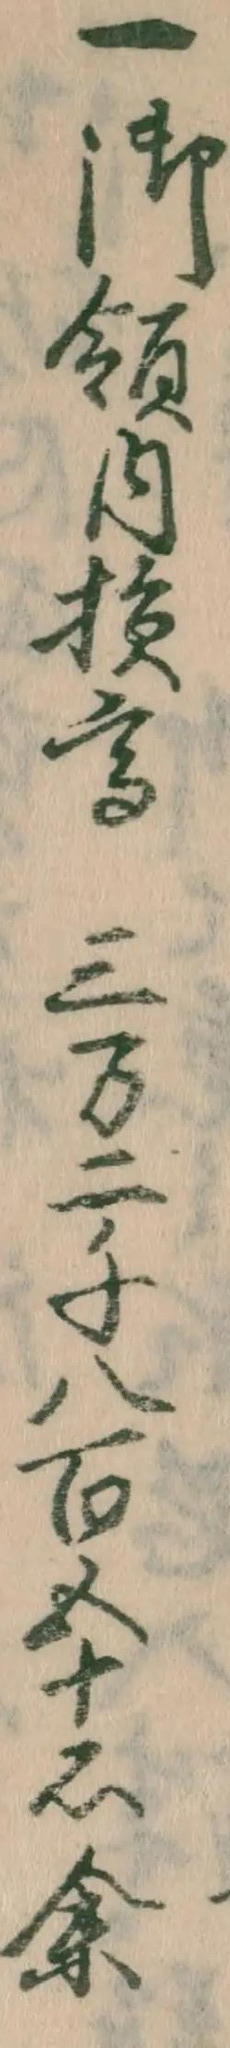一御領内損高三万二千八百五十石余
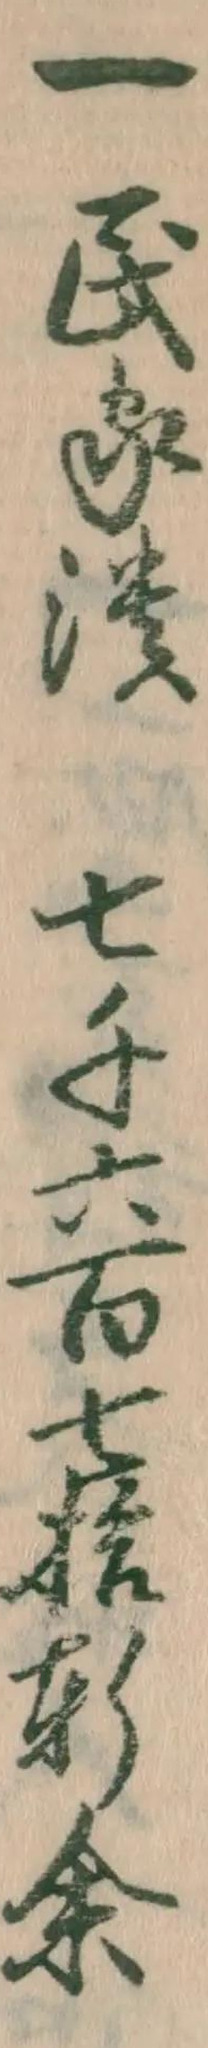一民家潰七千六百七拾軒余
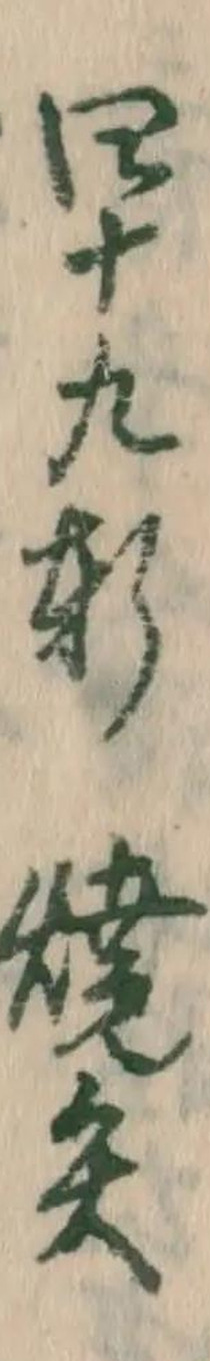四十九軒焼失
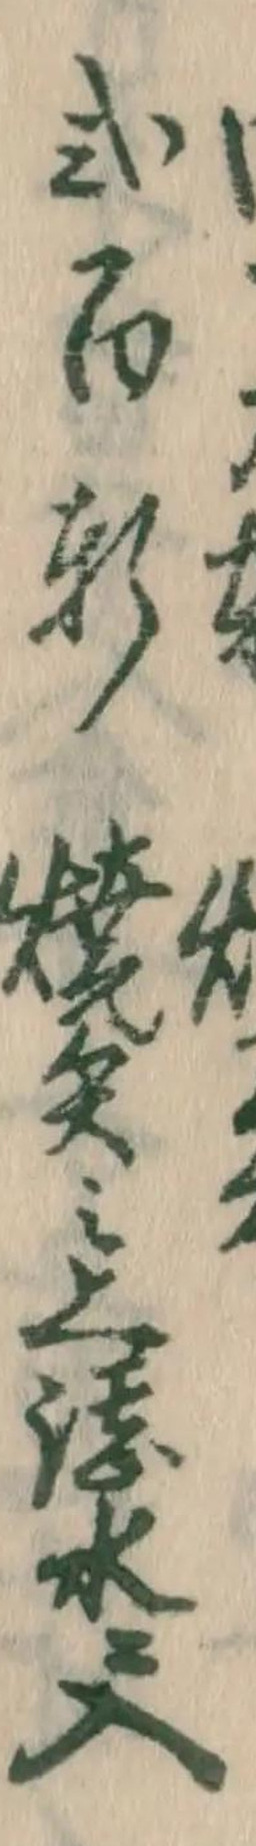弐百軒焼失之上湛水二入
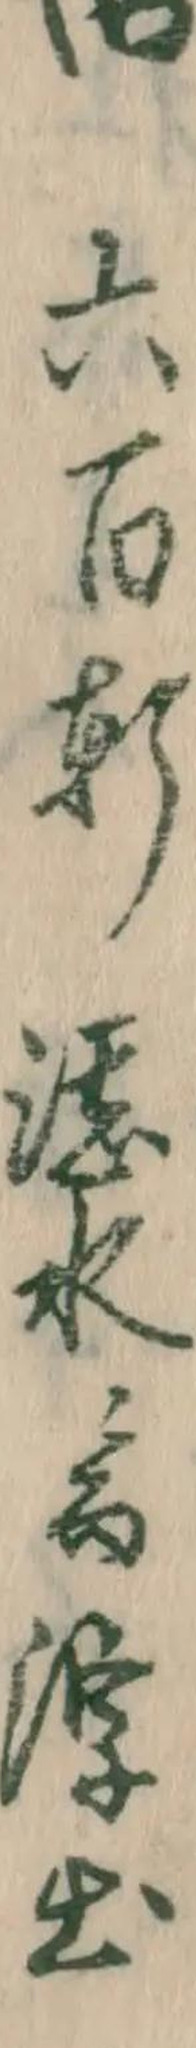内六百軒湛水二而浮出
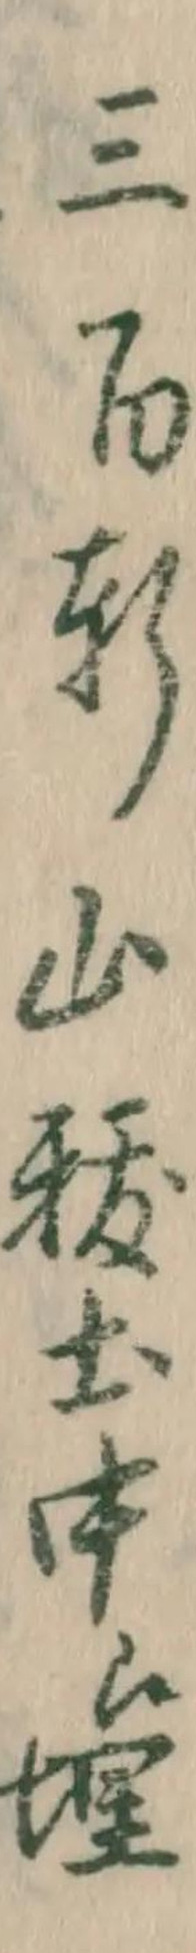三百軒山抜土中江埋
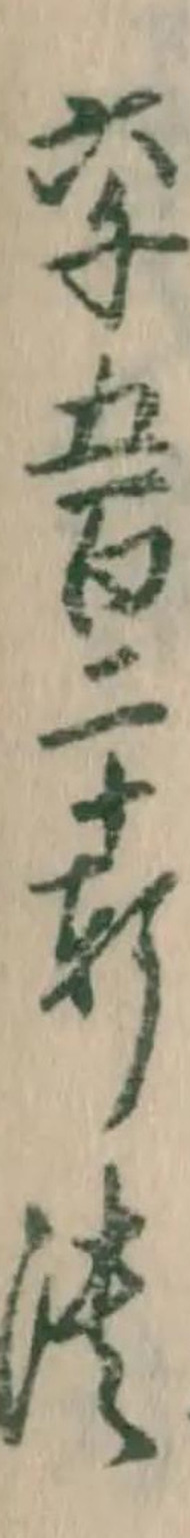六千五百二十軒潰

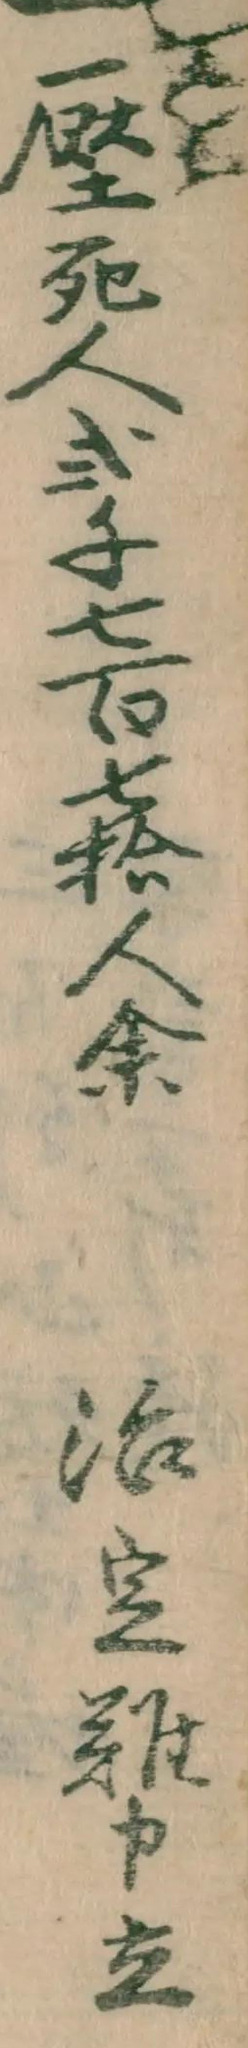一圧死人弐千七百七拾人余治定難申立
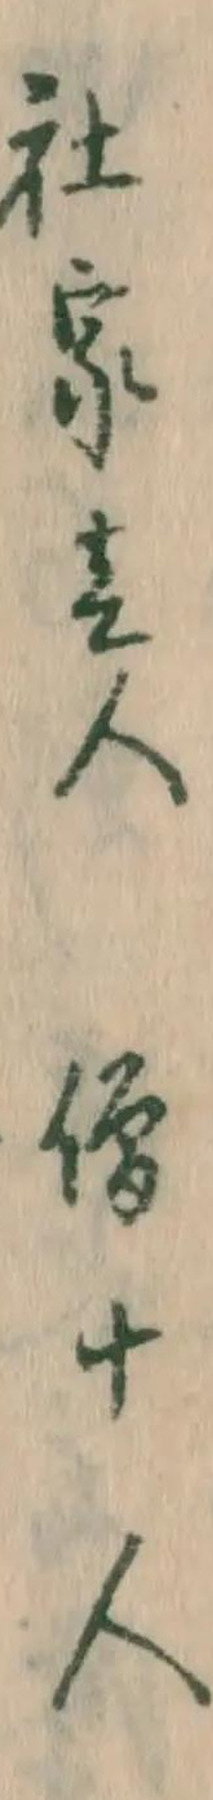社家壱人僧十人
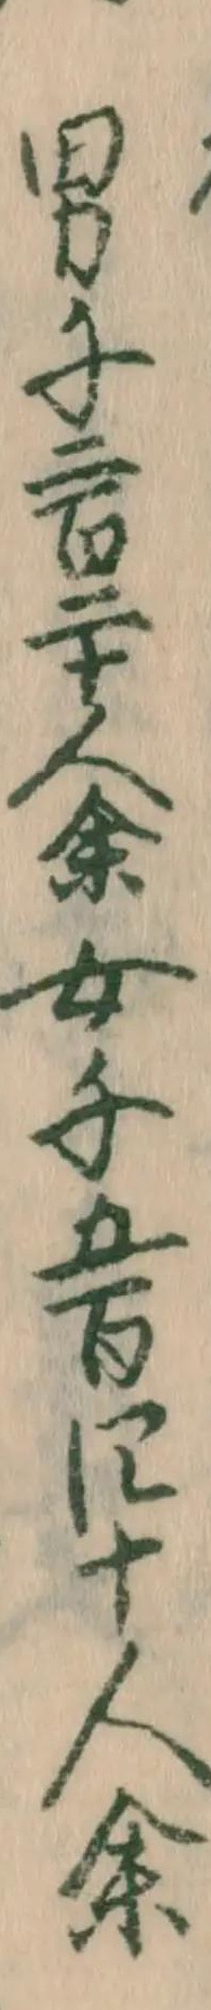内男千二百二十人余女千五百四十人余
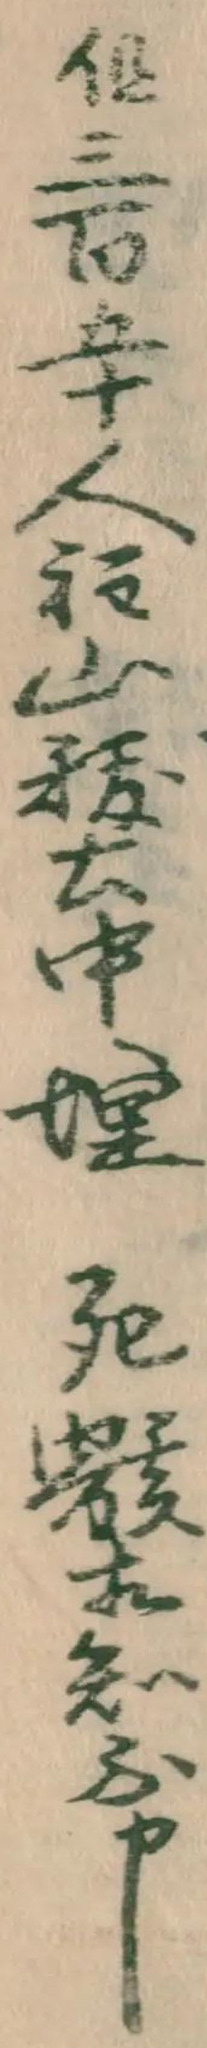但三百五十人程山抜土中へ埋死骸相知不申
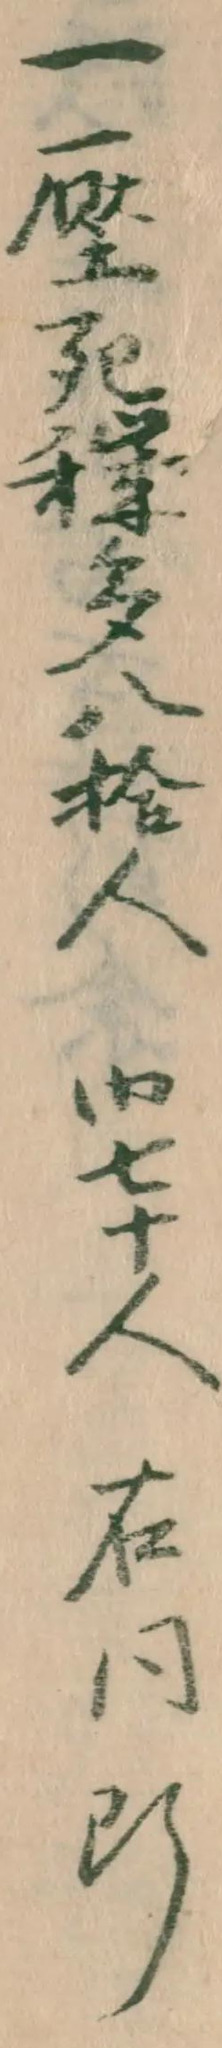一圧死穢多八拾人内七十人右同断
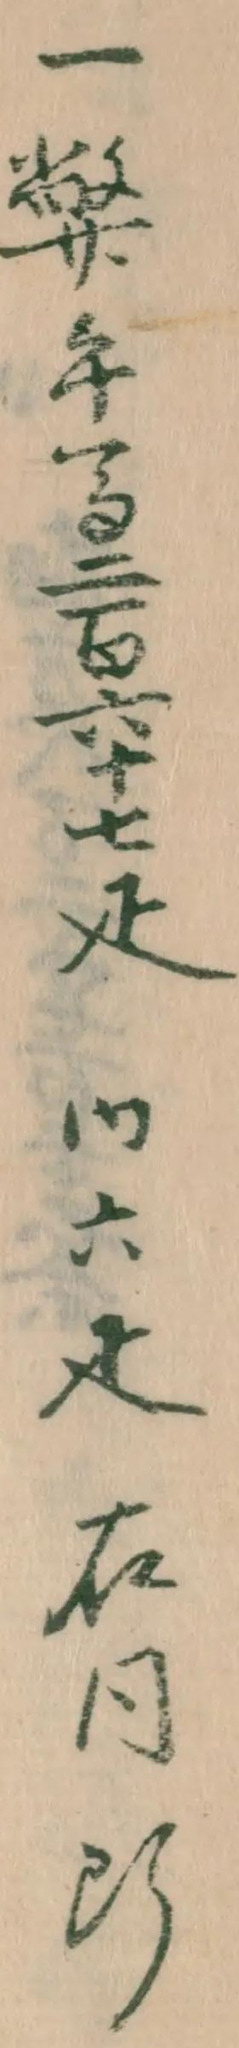一弊牛馬二百六十七疋内六疋右同断
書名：大地震
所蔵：国立国会図書館 National Diet Library, JAPAN
